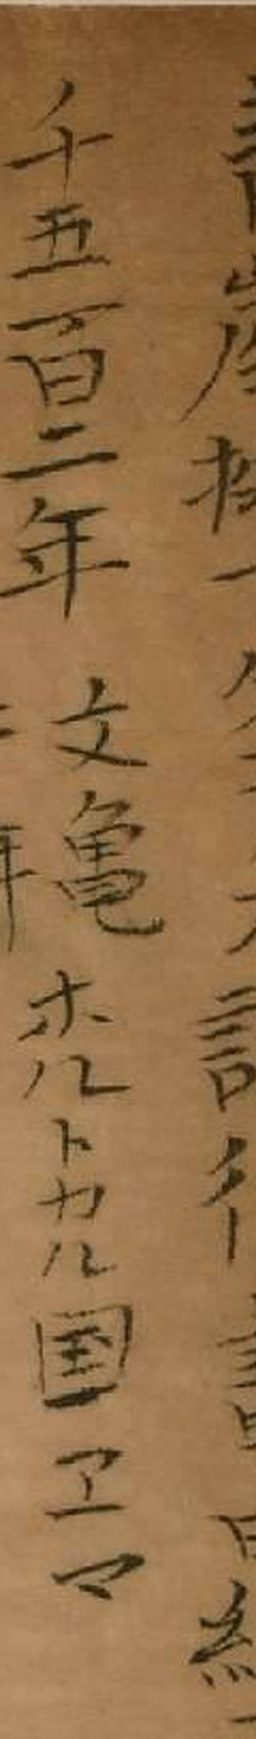千五百二年文亀二年ホルトカル国ヱマ
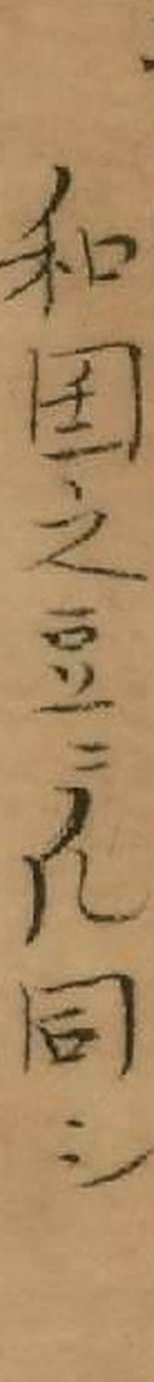和国之豆ニ凡同シ
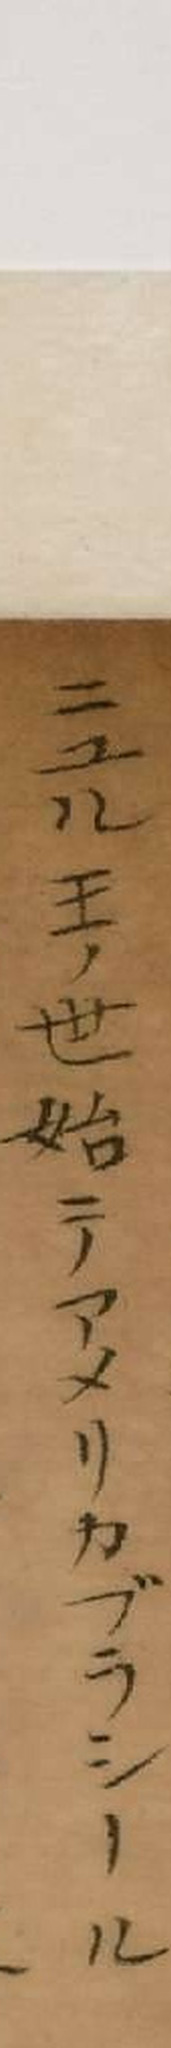ニユル王ノ世始テアメリカブラシール
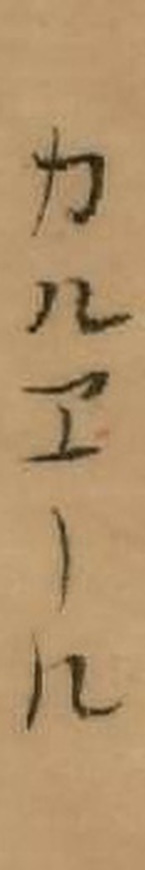カルヱール
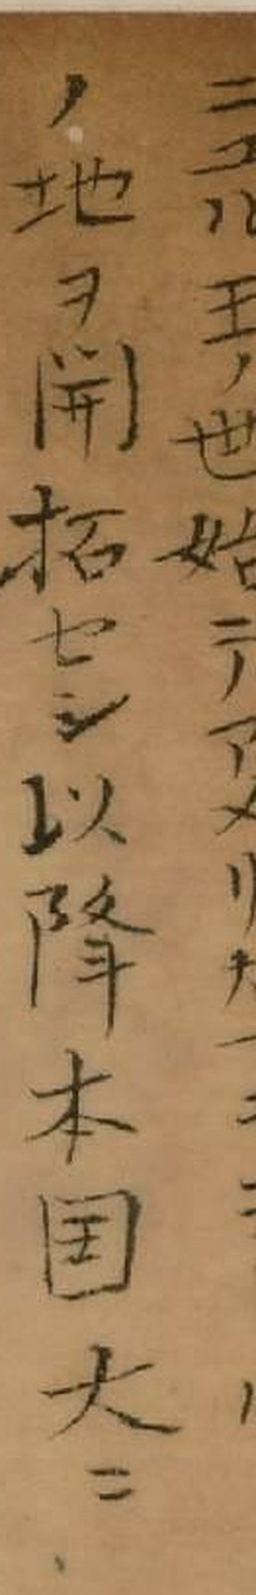ノ地ヲ開拓セシ以降本国大ニ
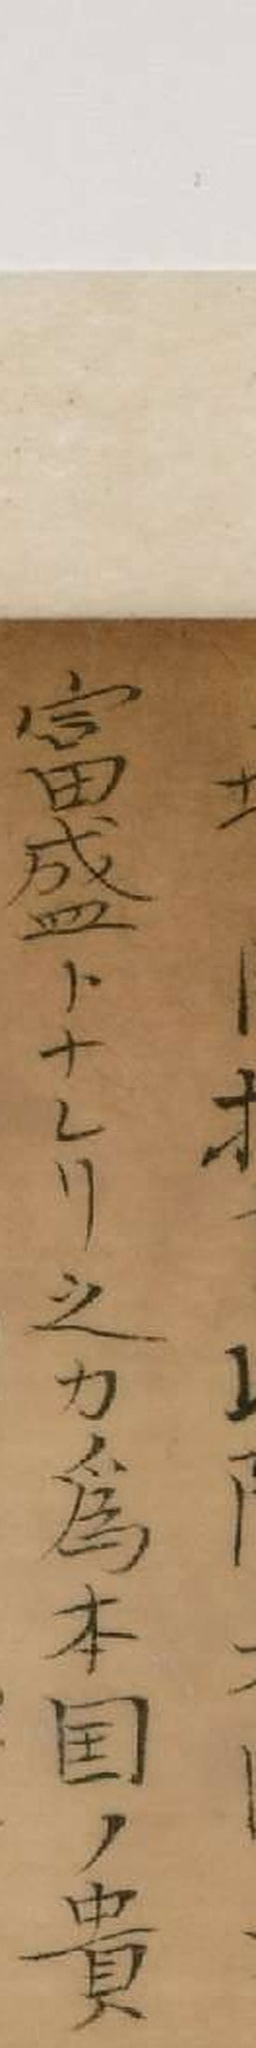富盛トナレリ之カ為本国ノ貴
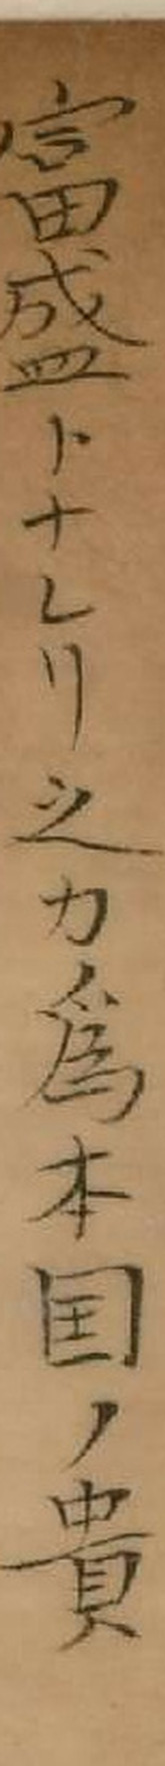富盛トナレリ之カ為本国ノ貴
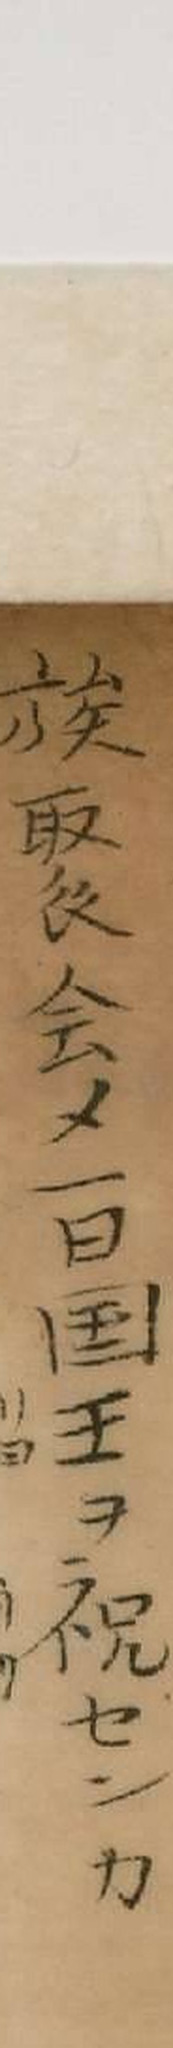族聚会シテ一日国王ヲ祝センカ
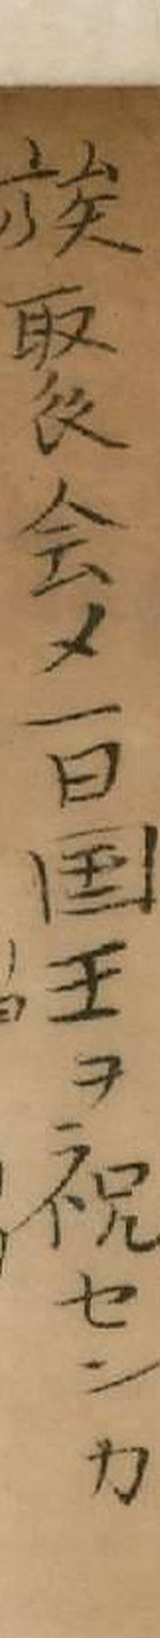族聚会シテ一日国王ヲ祝センカ
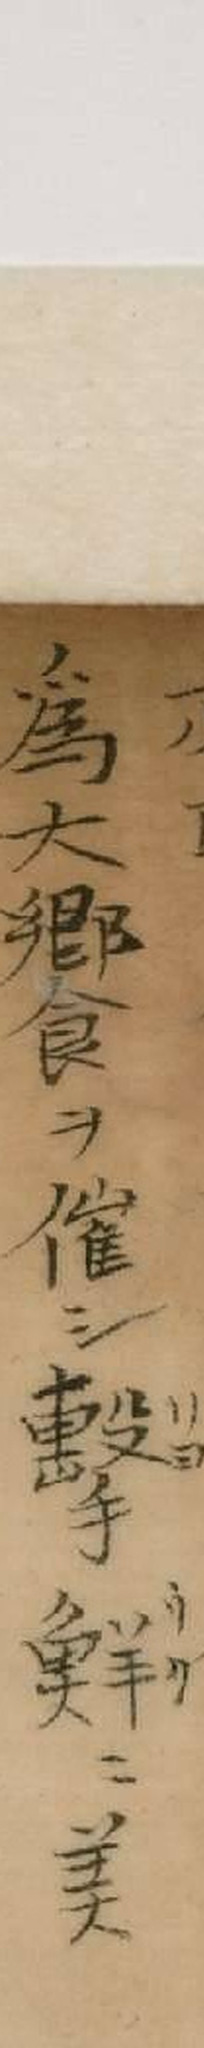為大饗ヲ催シ撃鮮ニ美
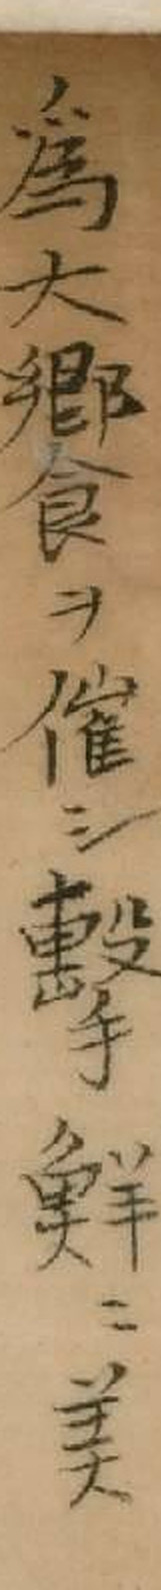為大饗ヲ催シ撃鮮ニ美
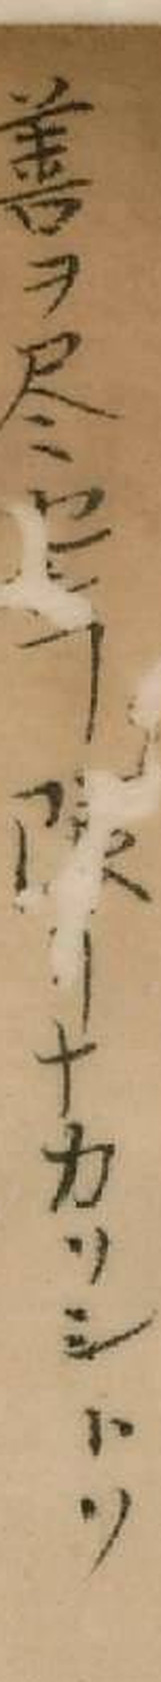善ヲ尽セシヿ限リナカリシトソ
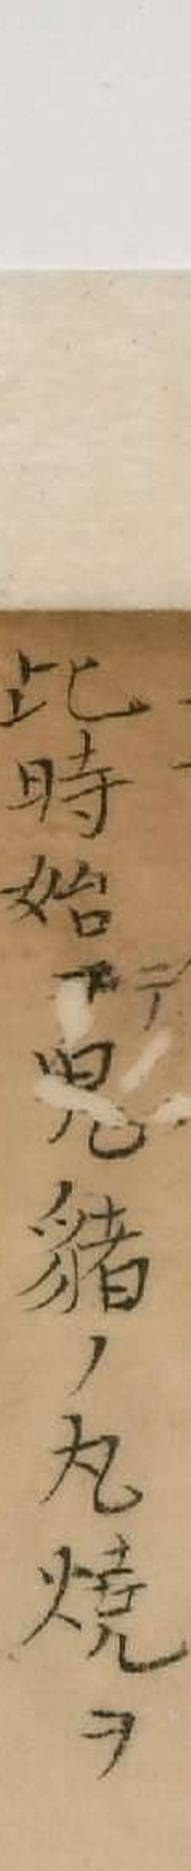此時始テ児猪ノ丸焼ヲ
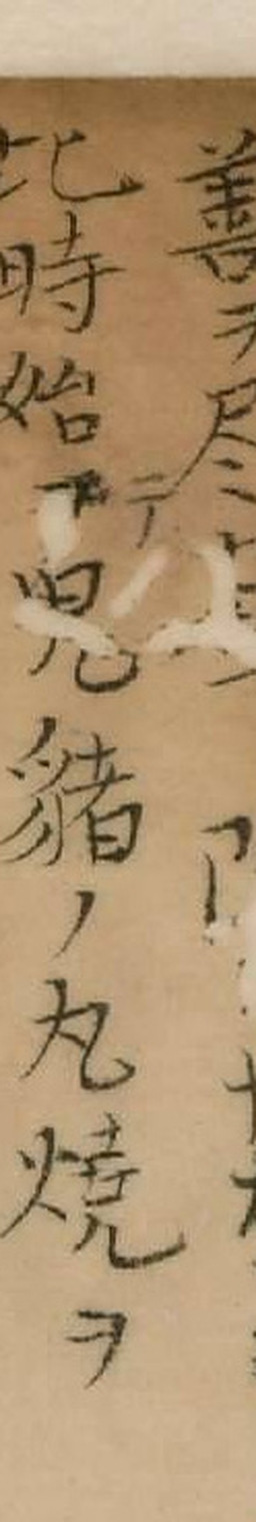此時始テ児猪ノ丸焼ヲ
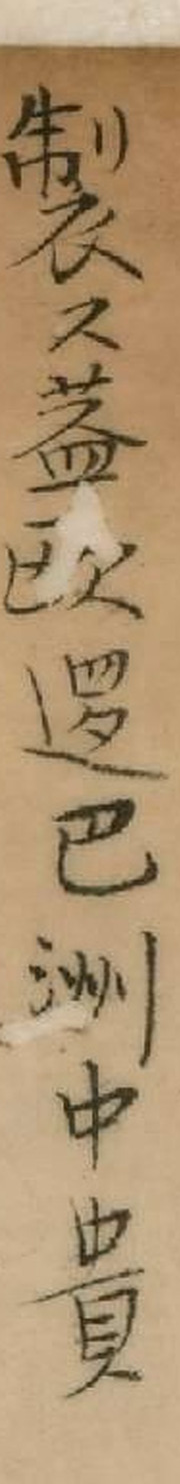製ス蓋欧邏巴洲中貴
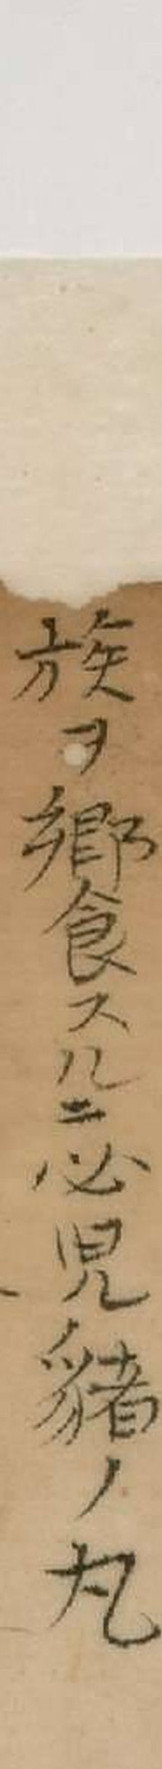族ヲ饗スルニ必児猪ノ丸
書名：和蘭規式料理絵図
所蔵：神戸大学附属図書館 国文学研究資料館
